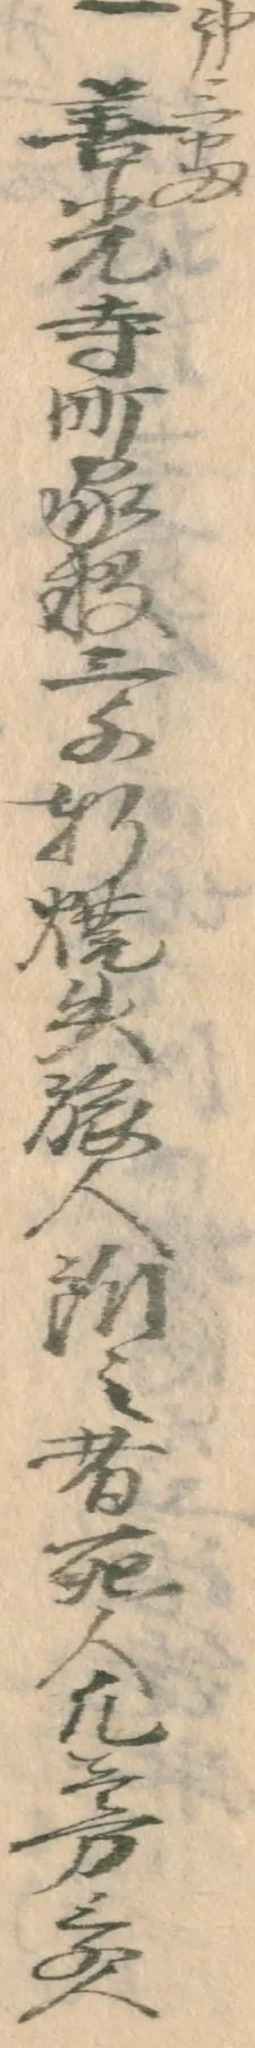一善光寺町家数三千軒焼失旅人所之者死人凡壱万三千人
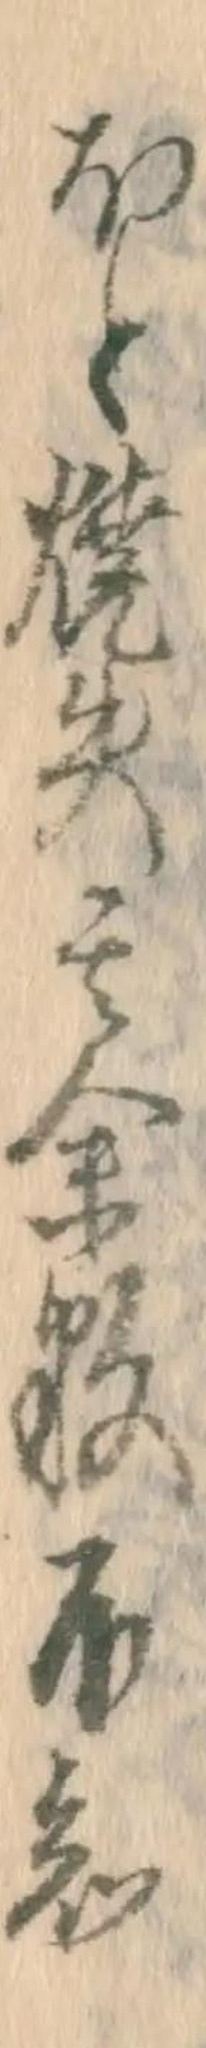ほと焼失其余数不知
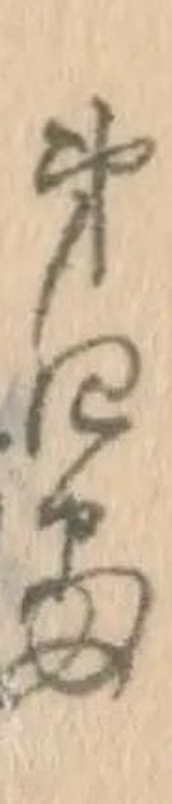第四番
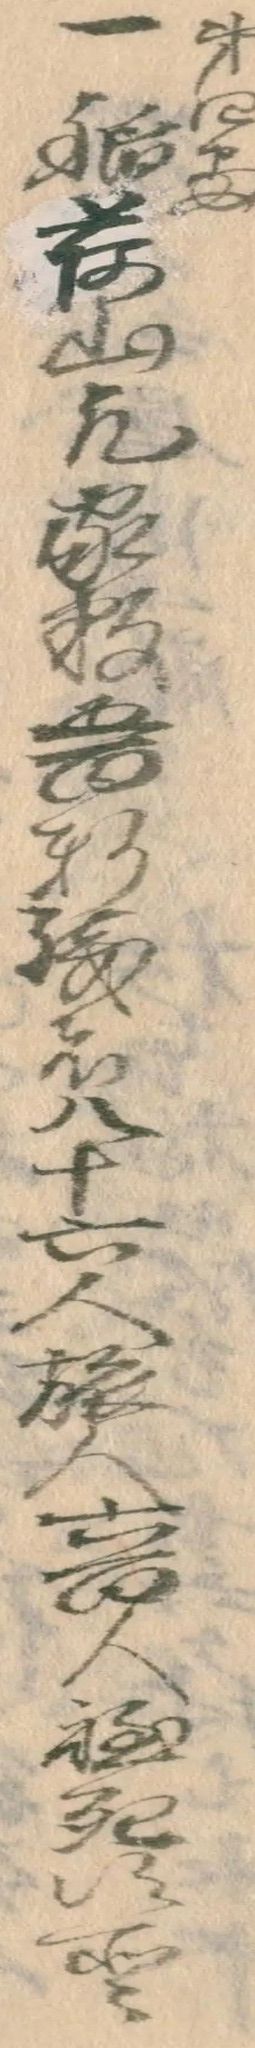一稲荷山凡家数五百軒残者八十六人旅人六百人程死す所々
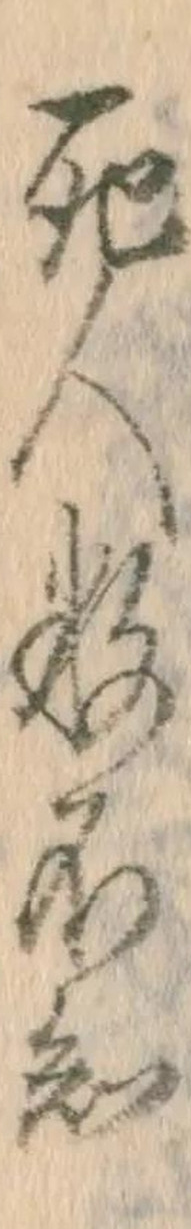死人数不知
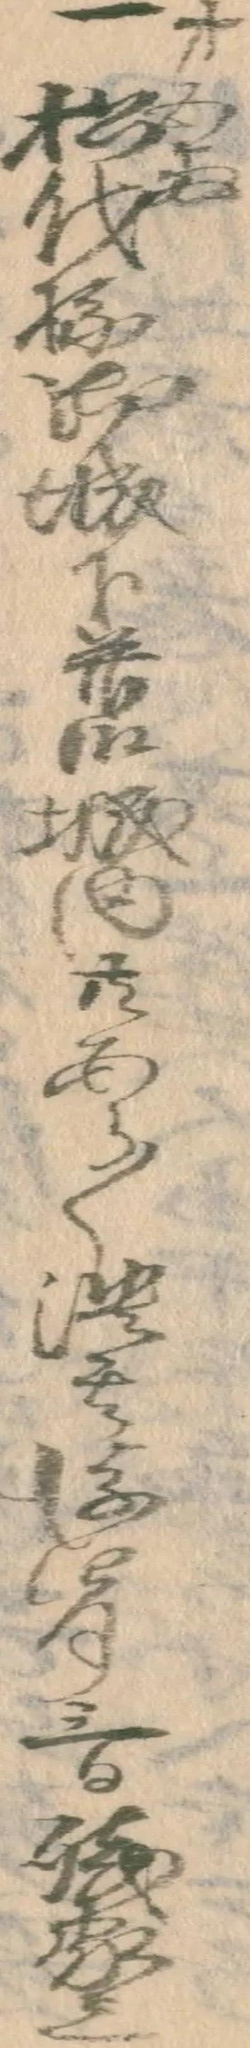一松代様御城下并御城内共あら〳〵潰其後四月三日残家迄
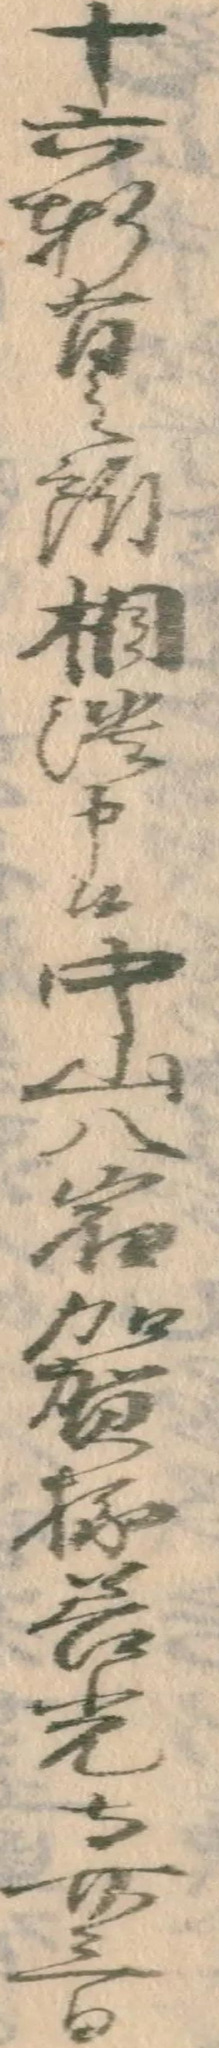十六軒有之所相潰申候中山八宿加賀様善光寺廿三日
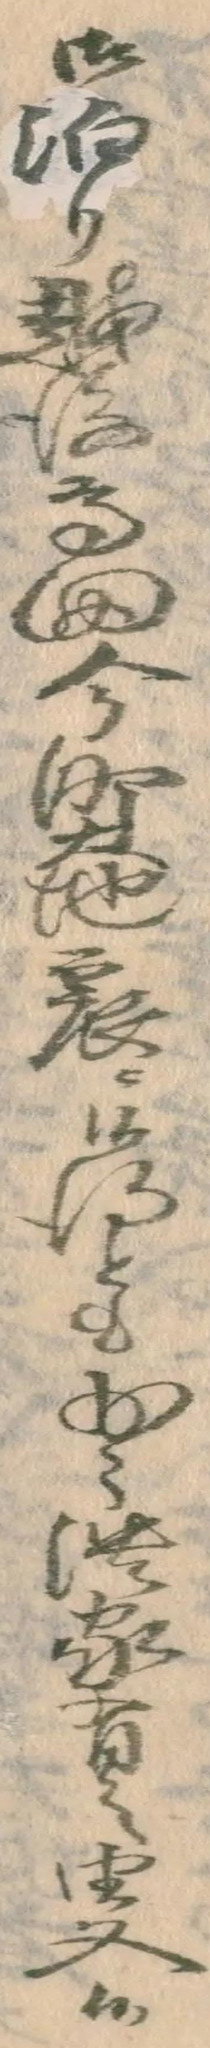御泊り越後高田今町大地震二候得とも少々潰家有之由又候
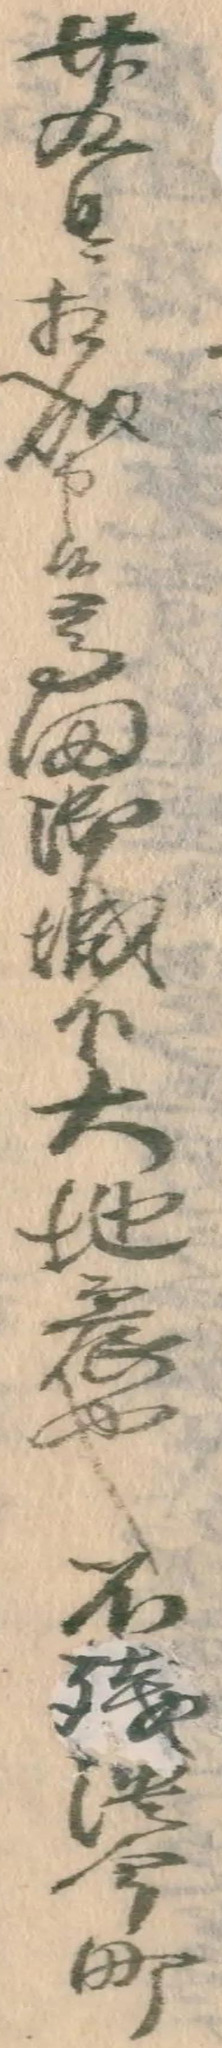廿九日二相成申候高田御城下大地震也不残潰今町
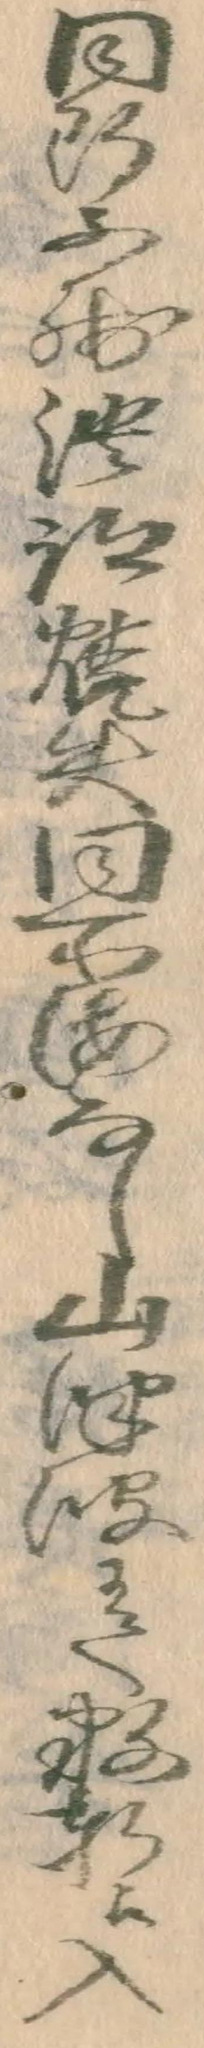同所不残潰跡焼失同所海なし山津波にて数軒江入
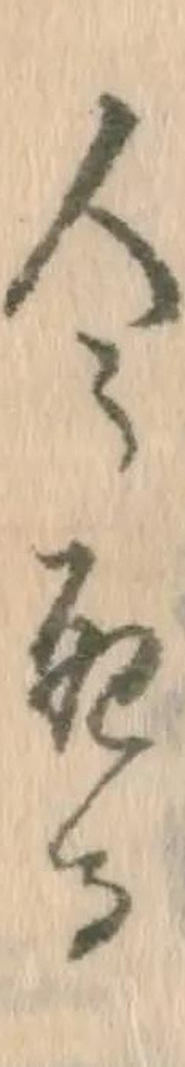人々死る
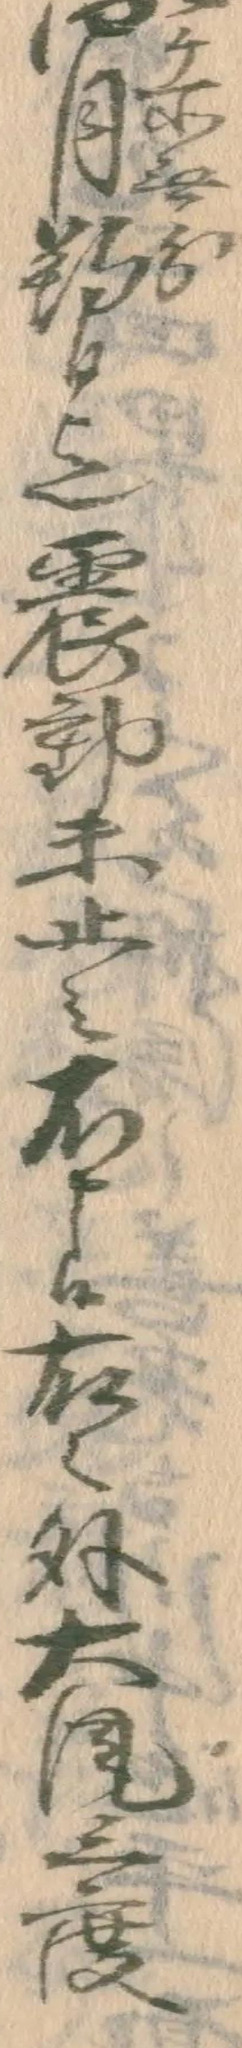四月朔日迄震動未止之不申候右之外大風三度
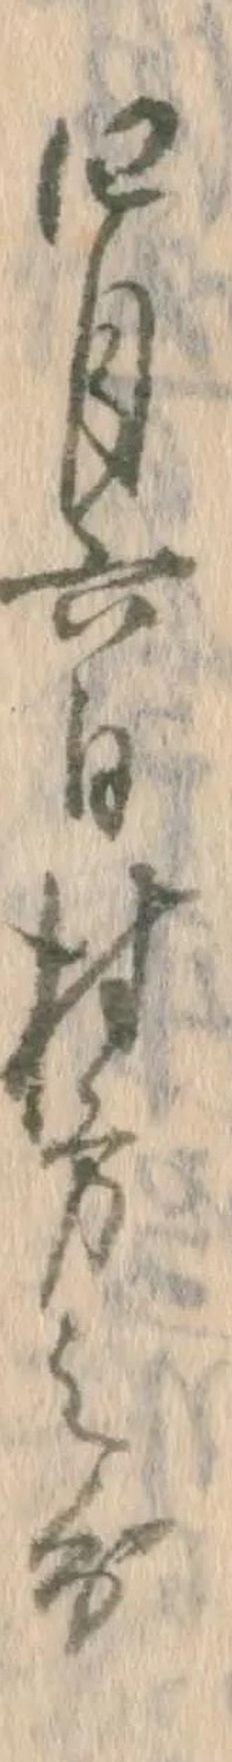四月六日村方之分
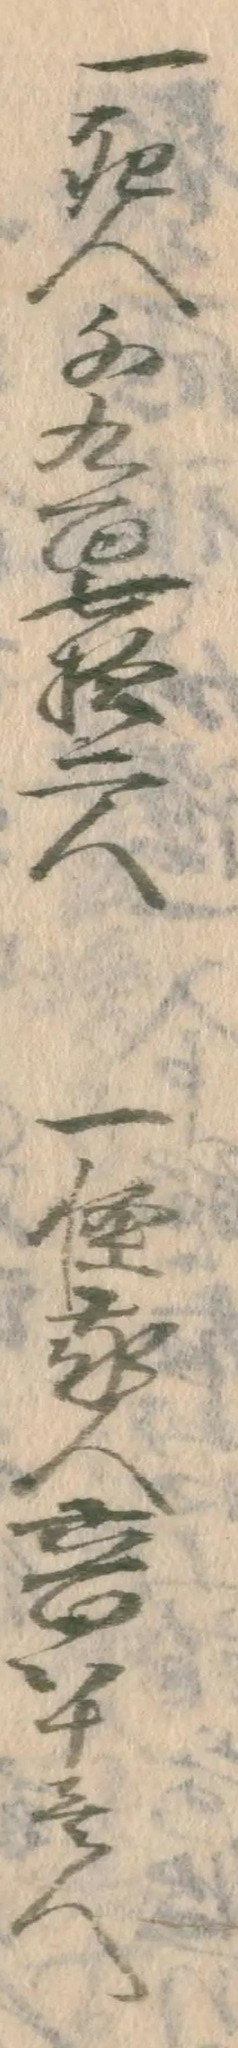一死人千九百七拾二人一怪我人六百八十壱人
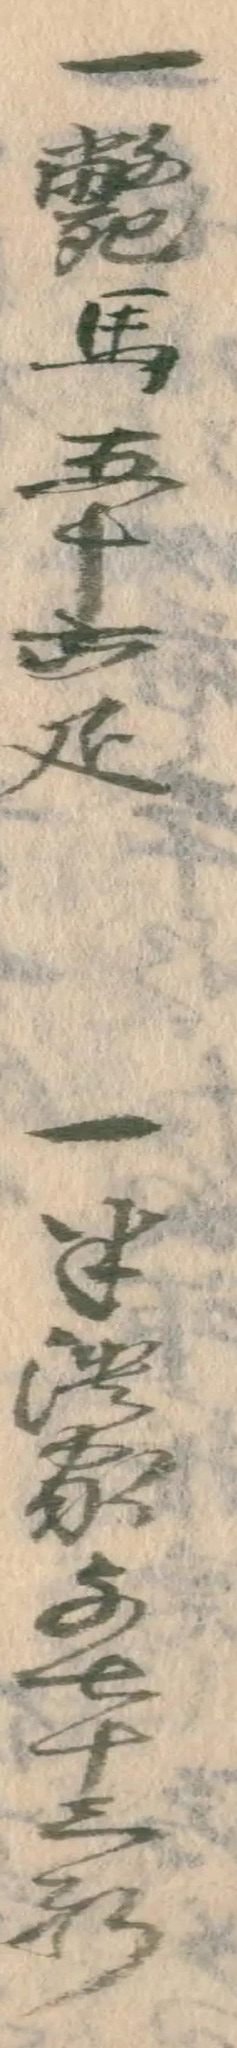一斃馬五十六疋一半潰家千七十三軒
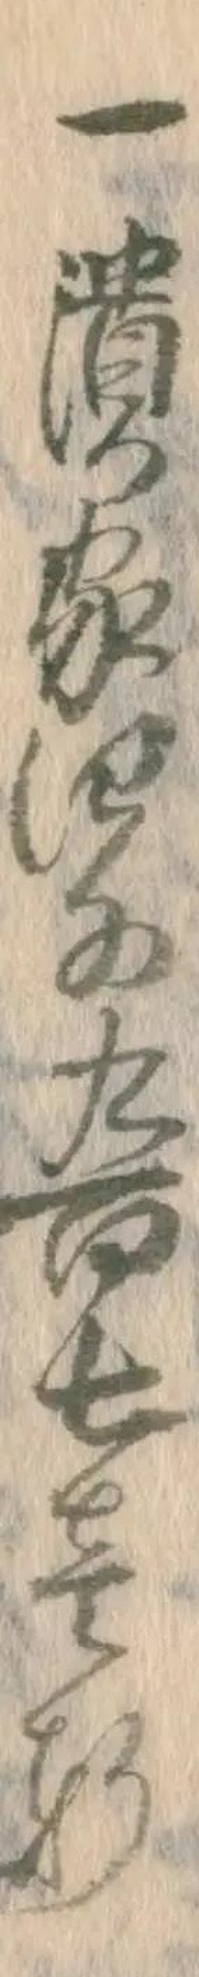一潰家四千九百七十壱軒
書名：信州大地震之記
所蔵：国立国会図書館 National Diet Library, JAPAN
